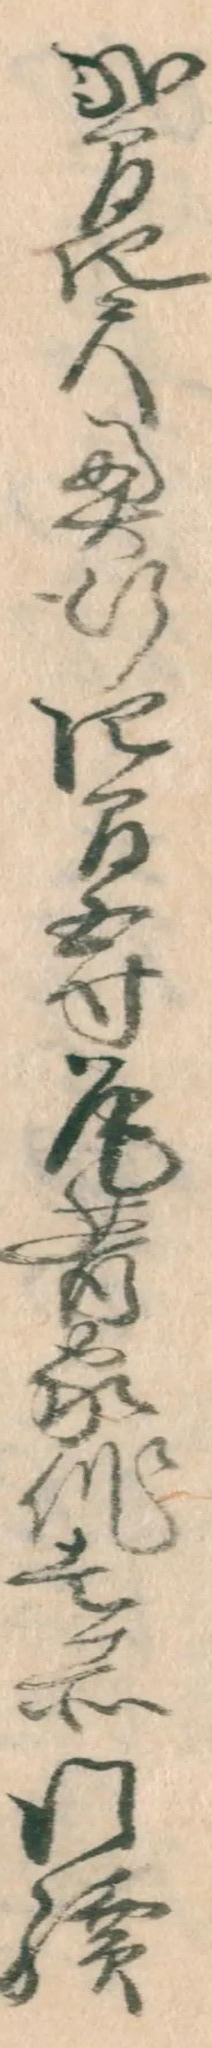弐間四尺奥行四間五寸瓦葺家作壱ヶ所同続
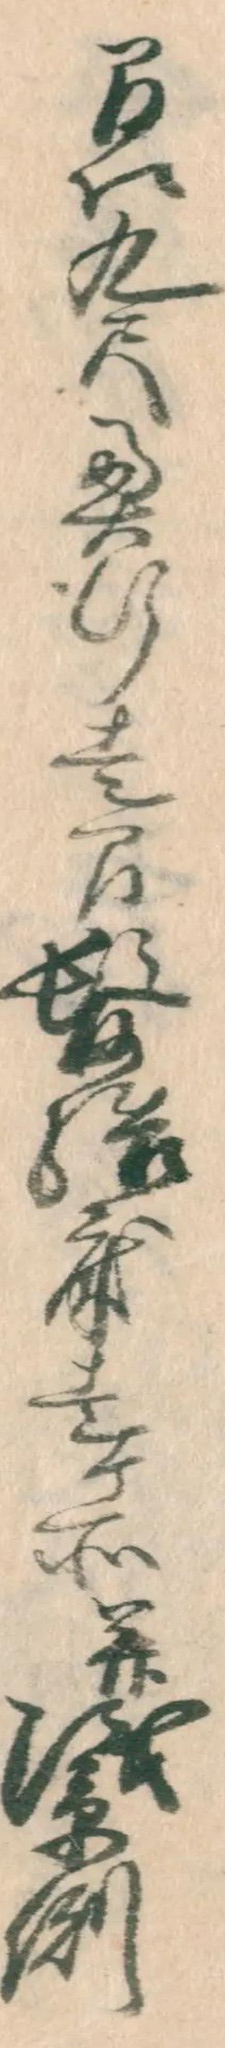間口九尺奥行壱間髪結床壱ヶ所幷浅草側
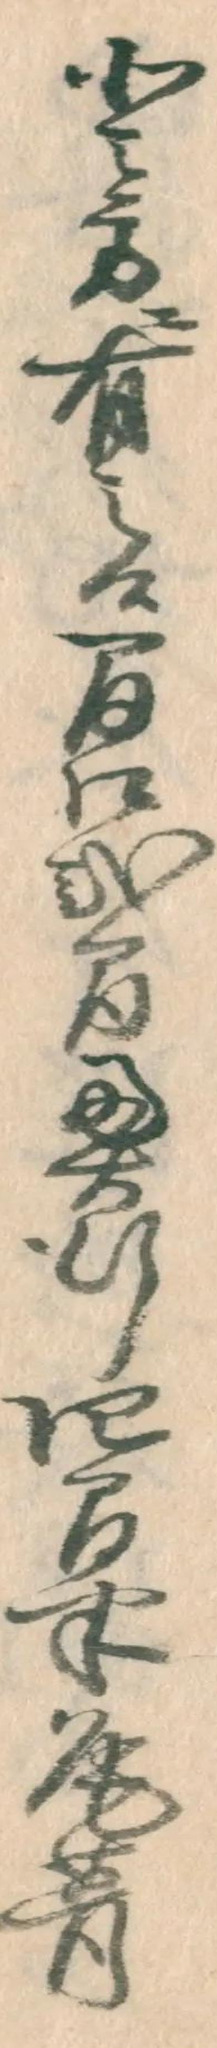北之方ニ有之候間口弐間奥行四間半瓦葺
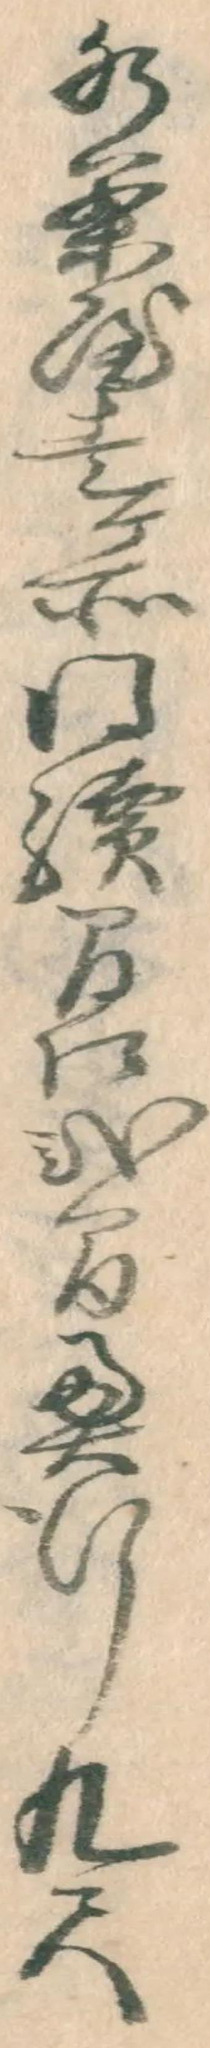水茶屋壱ヶ所同続間口弐間奥行九尺

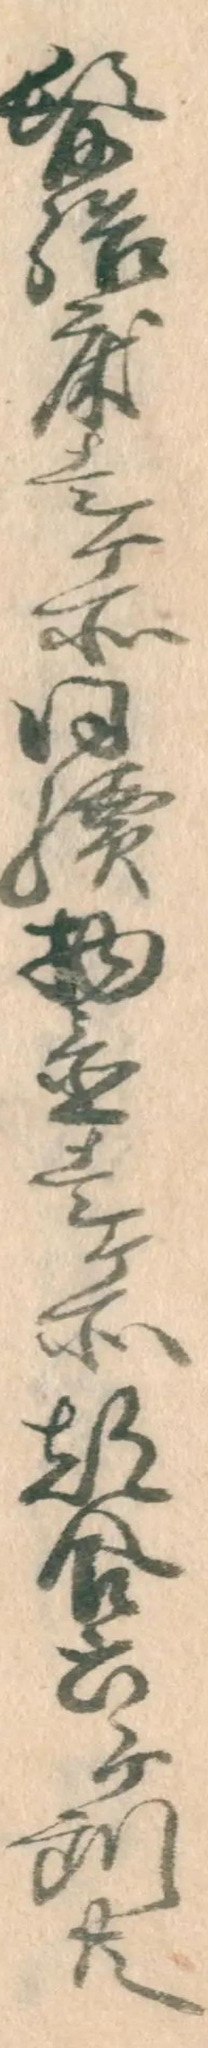髪結床壱ヶ所同続物置壱ヶ所都合六ヶ所共
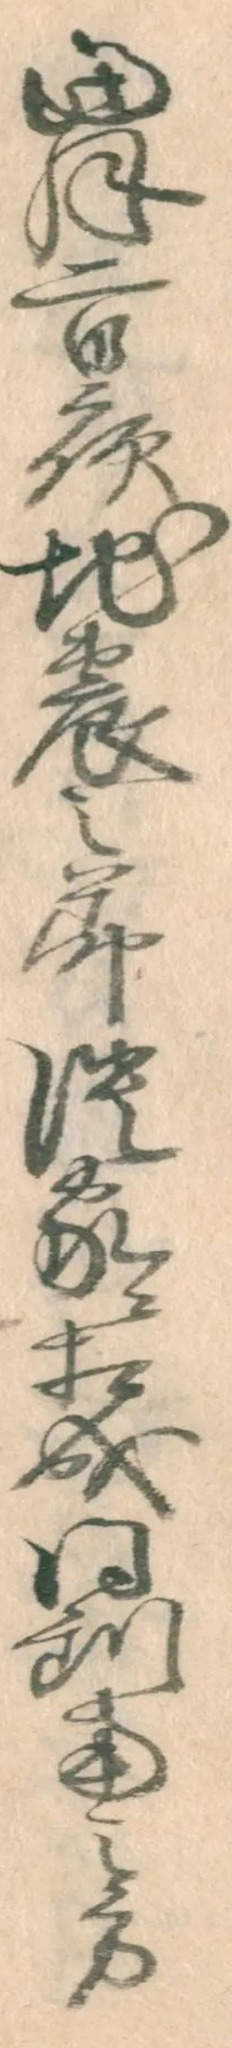当月二日夜地震之節潰家ニ相成同所南之方
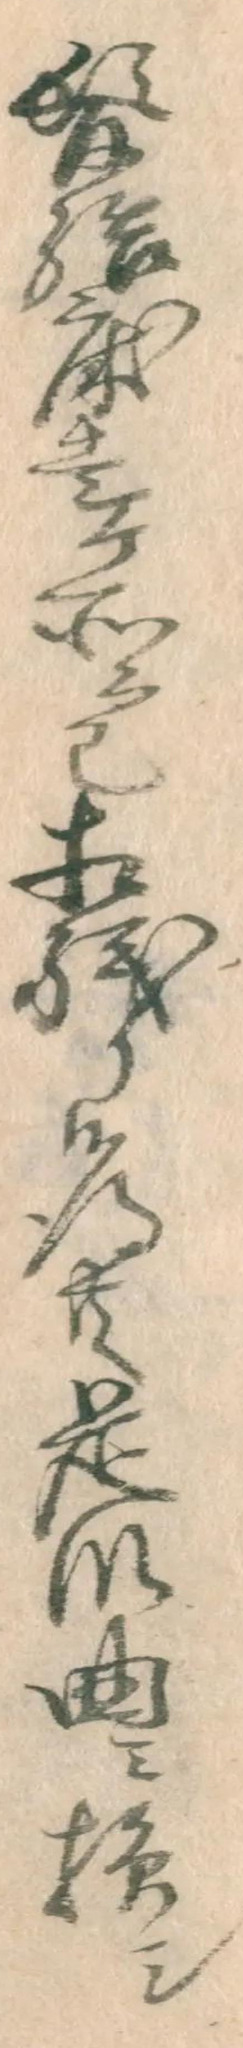髪結床壱ヶ所而已相残リ候得共是以曲ミ損シ
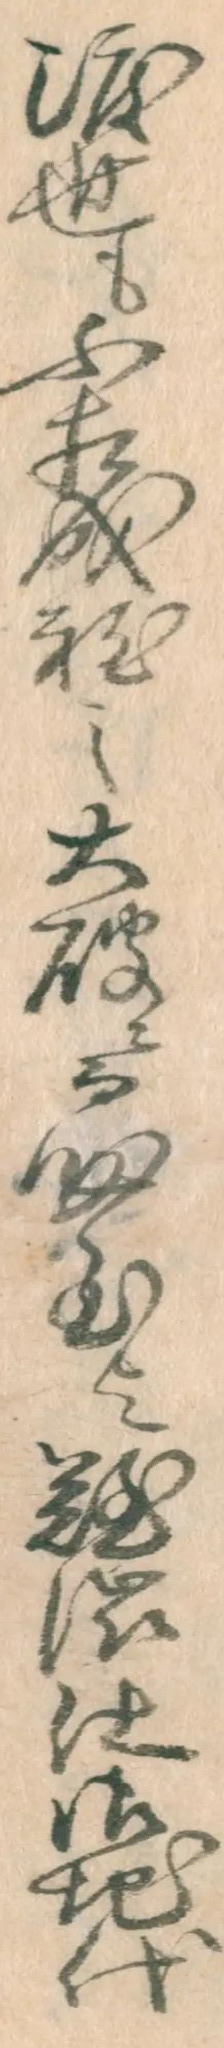渡世も不相成程之大破ニ而必至と難渋仕御地代
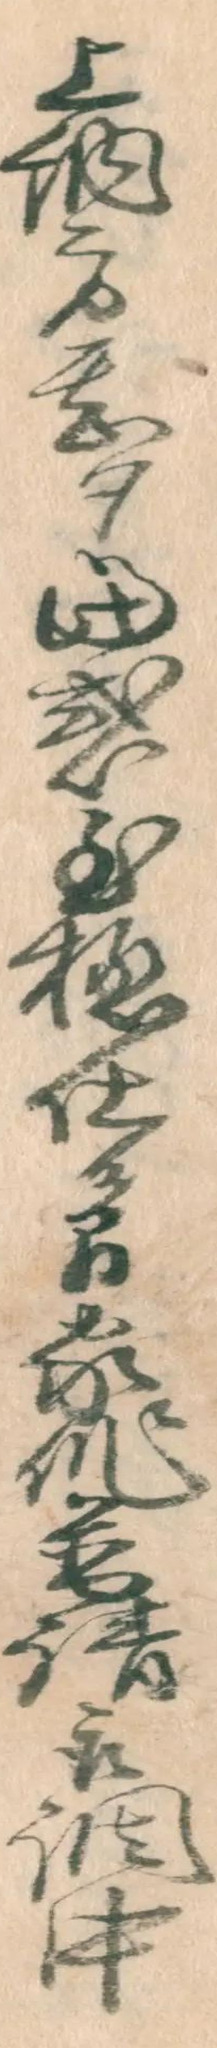上納方甚タ当惑至極仕候間家作普請取調中
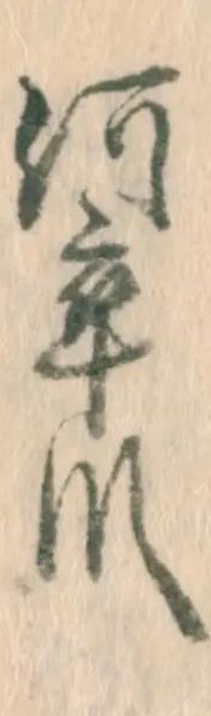何卒以
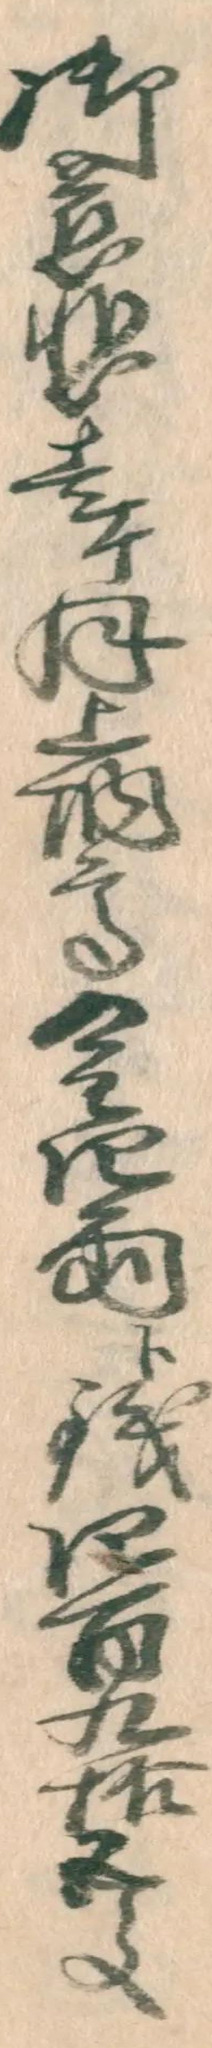御慈悲壱ヶ月上納高金四両ト銭四百九拾五文
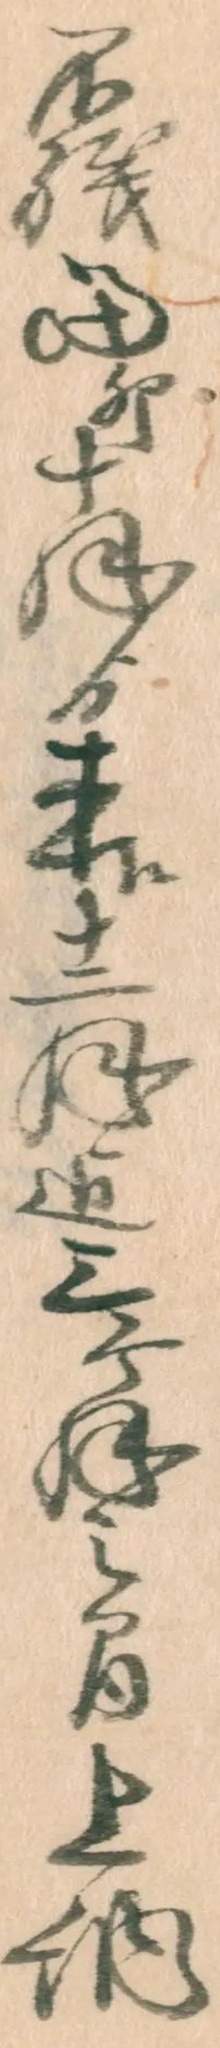不残当卯十月ゟ来ル十二月迄三ヶ月之間上納
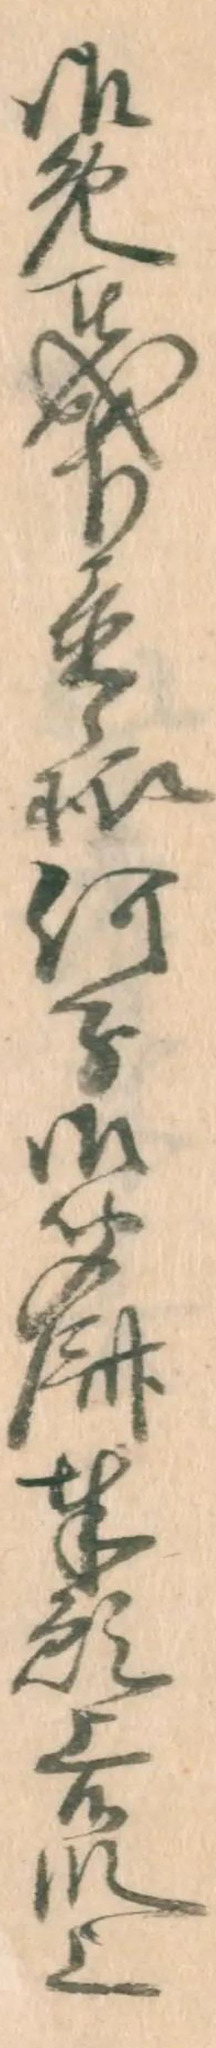御免被成下置候様何分御聞済奉願上候以上
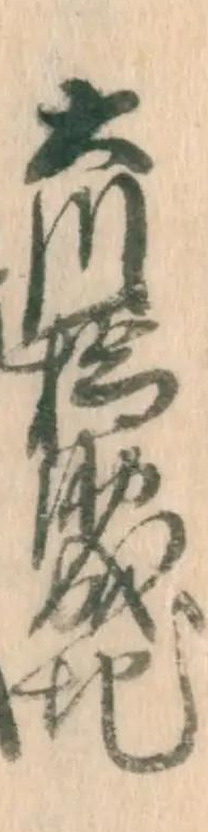大川橋助成地
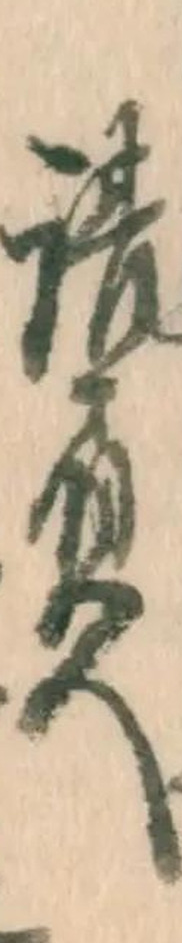請負人
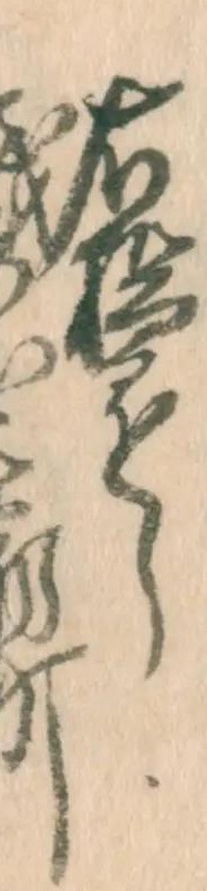右橋懸リ
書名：地震災書留 2巻. [1] 内表紙に「地震災書留　安政二卯年　但本所深川御用屋敷地代免除調」とあり
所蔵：国立国会図書館 National Diet Library, JAPAN
